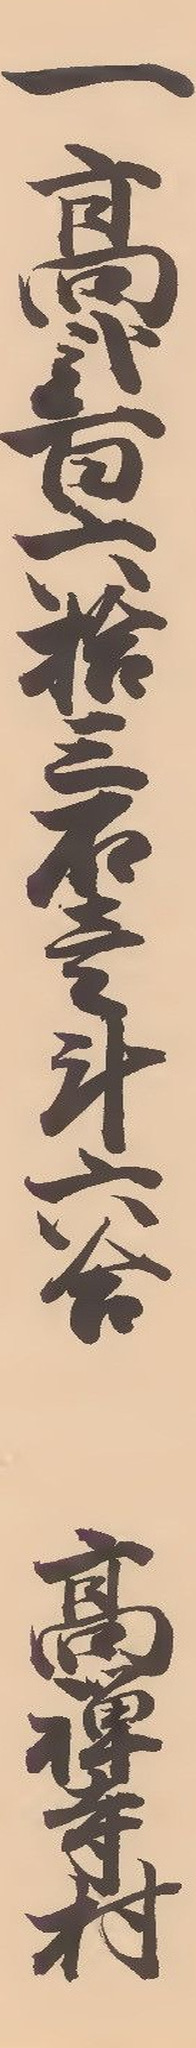一高弐百六拾三石壱斗六合高禅寺村

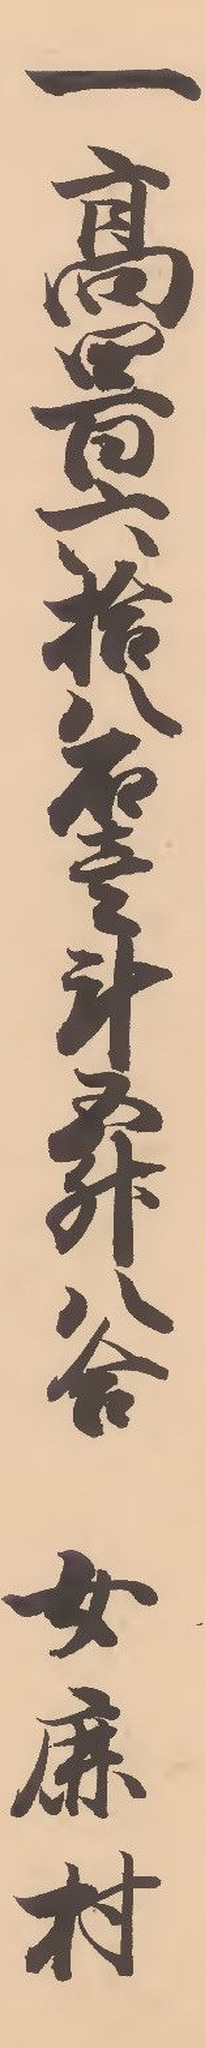一高四百六拾八石壱斗五升八合女鹿村
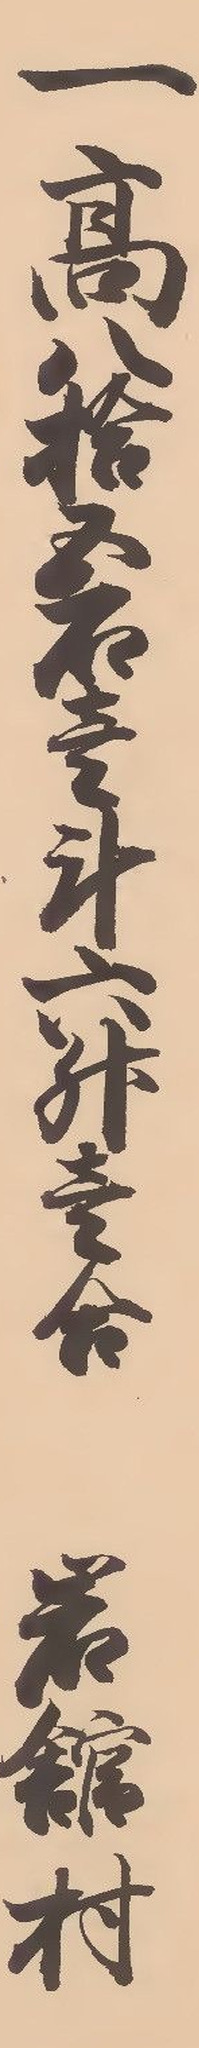一高八拾五石壱斗六升壱合岩館村
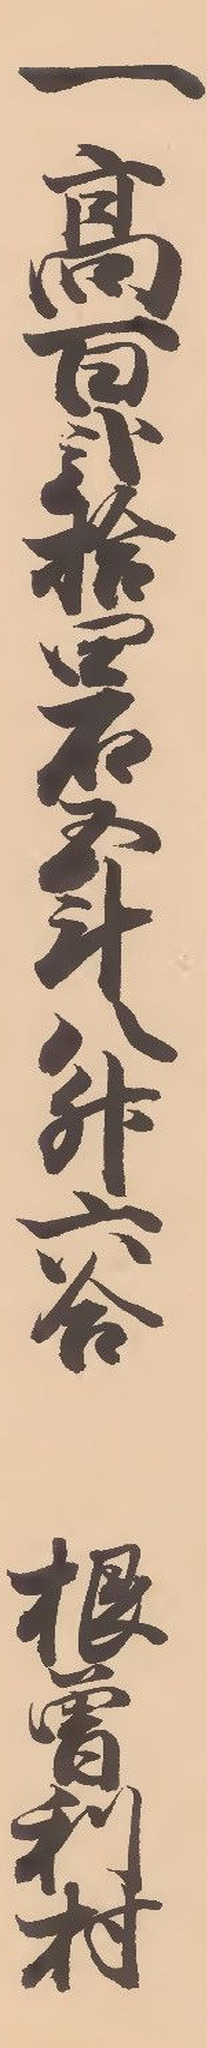一高百弐拾四石五斗八升六合根曽利村
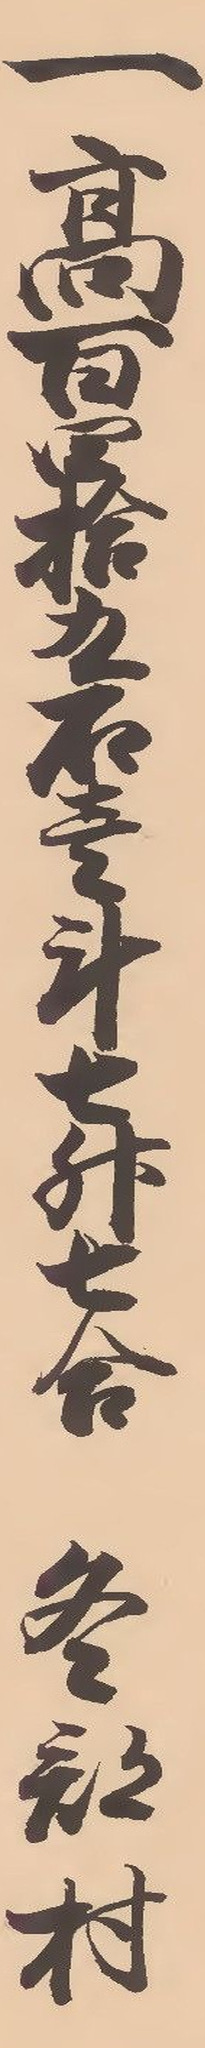一高百四拾九石壱斗七升七合冬部村
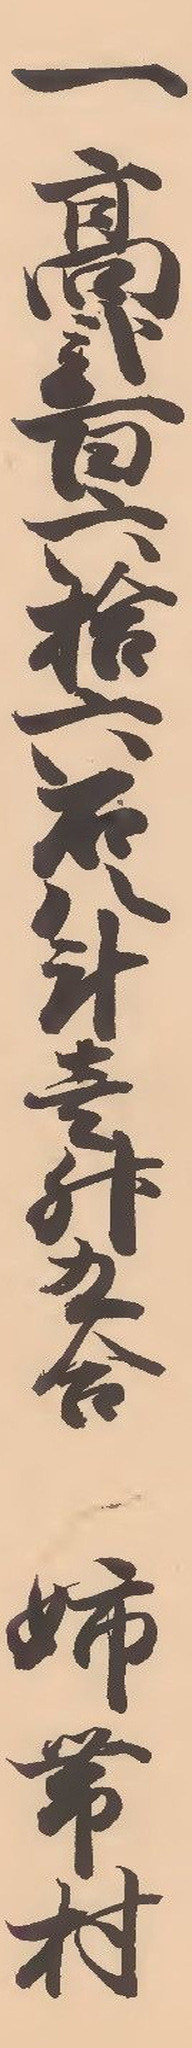一高弐百六拾六石八斗壱升九合姉帯村
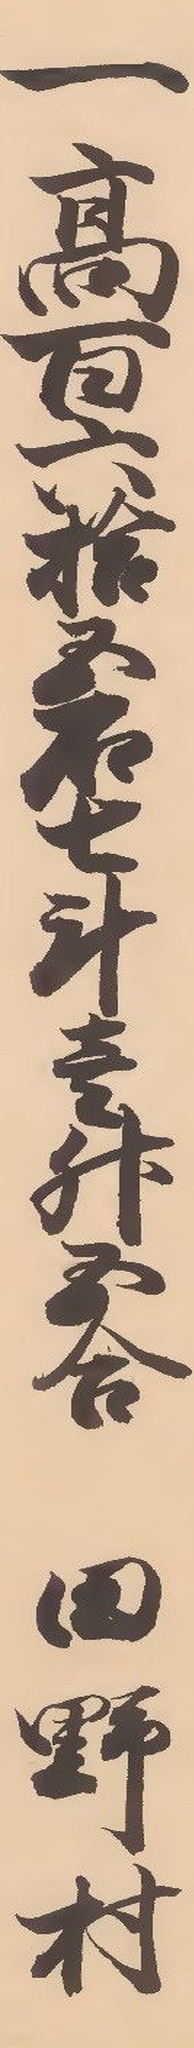一高百六拾五石七斗壱升五合田野村
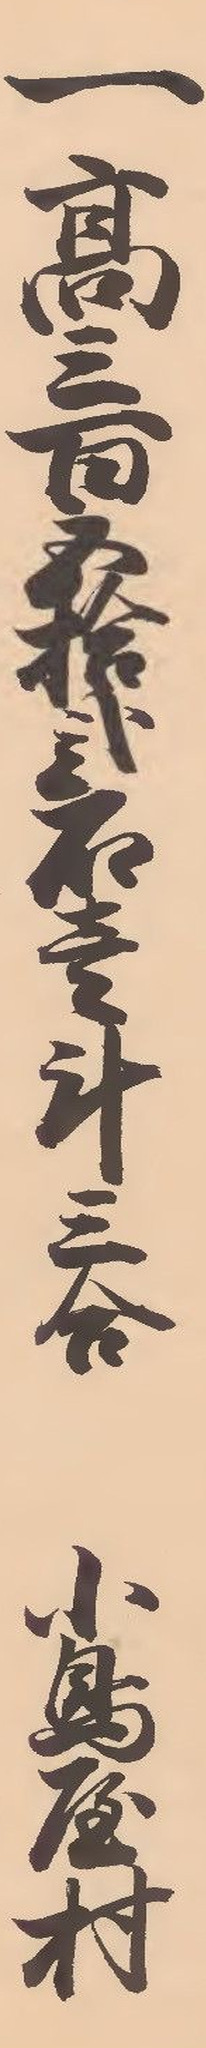一高三百五拾弐石壱斗三合小鳥屋村
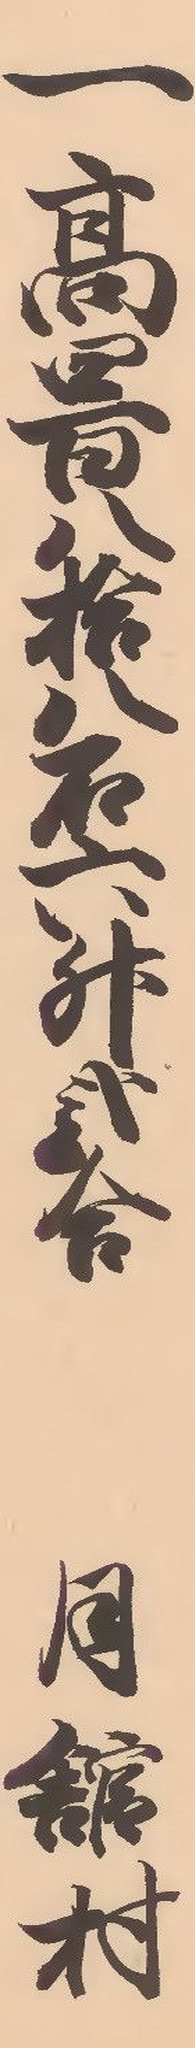一高四百八拾八石六升弐合月館村

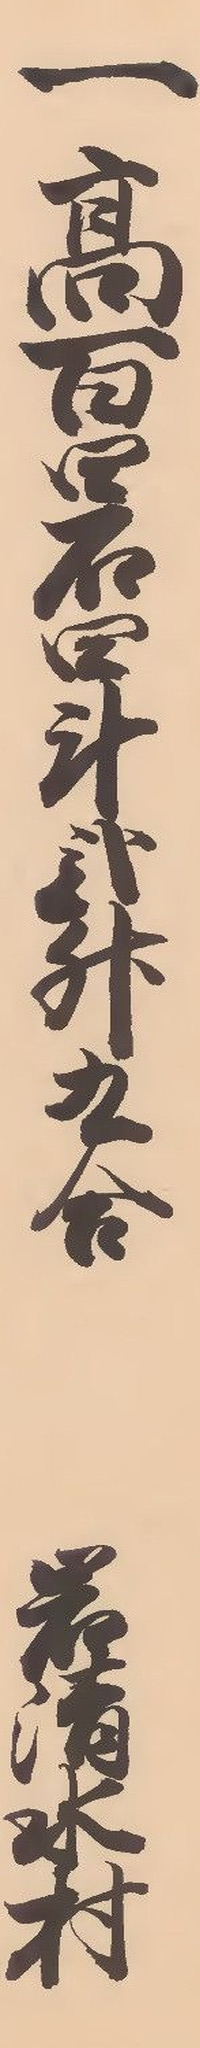一高百四石四斗弐升九合岩清水村
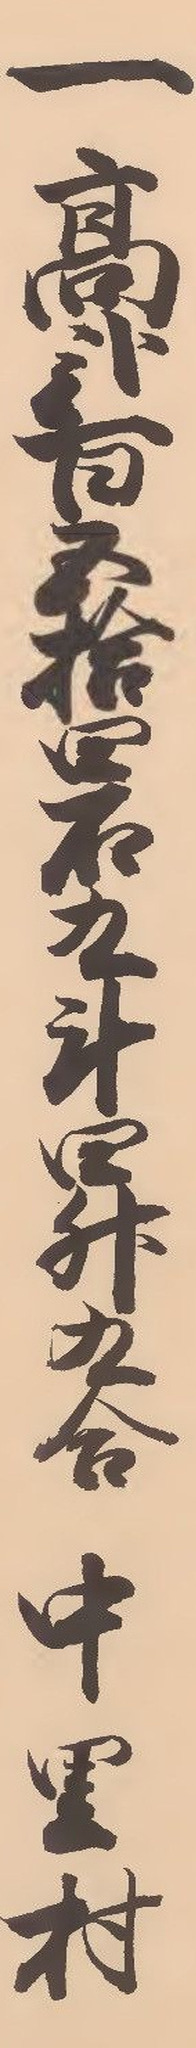一高弐百五拾四石九斗四升九合中里村
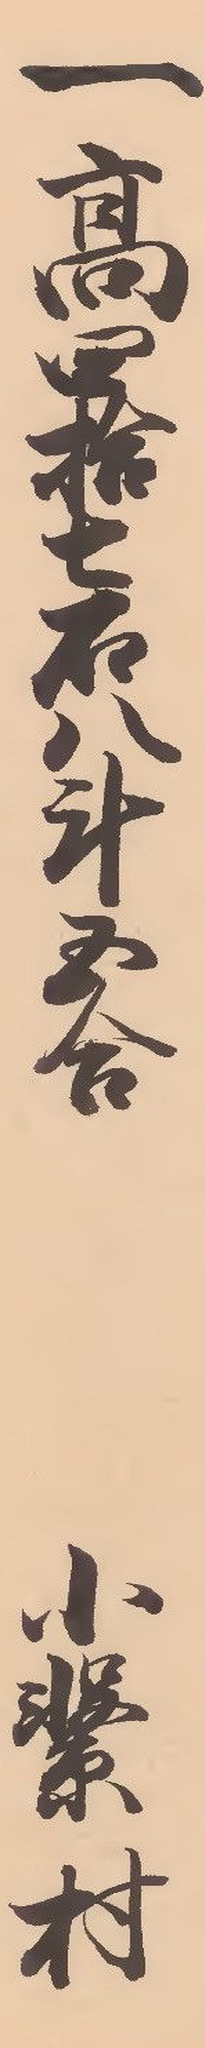一高四拾七石八斗五合小繋村
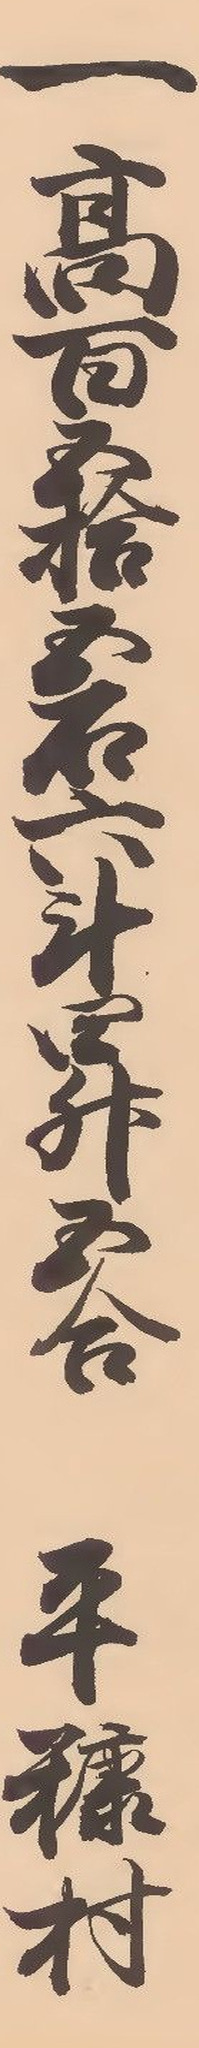一高百五拾五石六斗四升五合平糠村
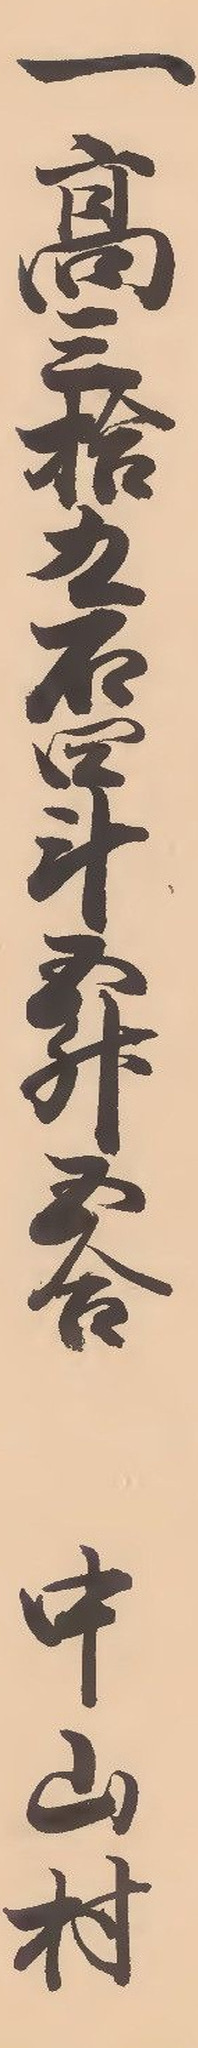一高三拾九石四斗五升五合中山村
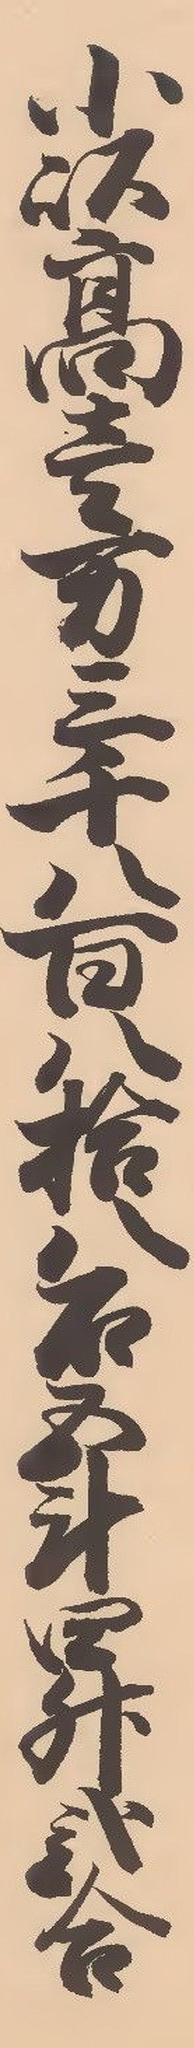小以高壱万三千八百八拾八石五斗四升弐合

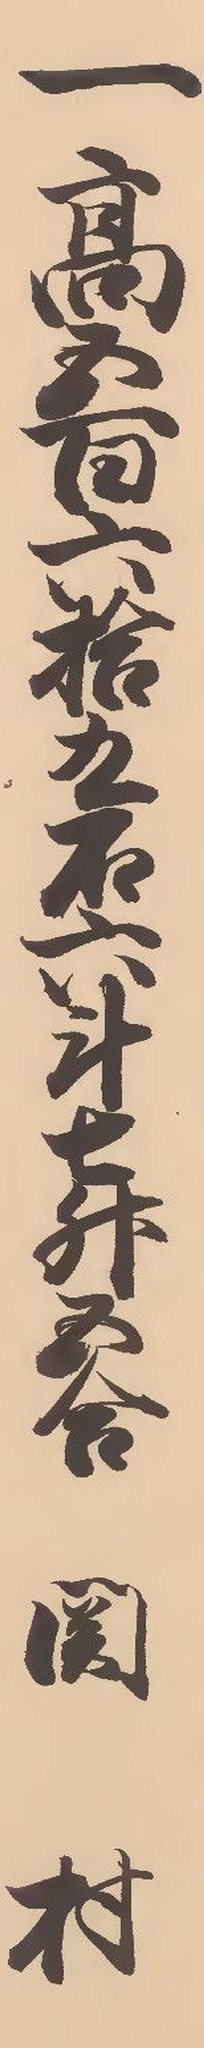一高五百六拾九石六斗七升五合関村
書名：陸奥国郷帳　６
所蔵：国立公文書館 National Archives of Japan
